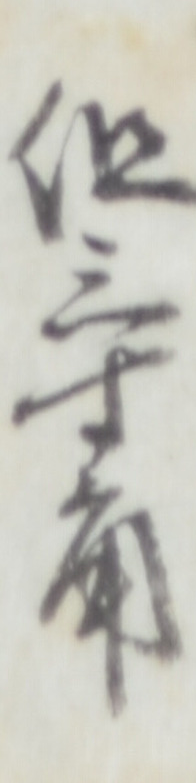但三寸角
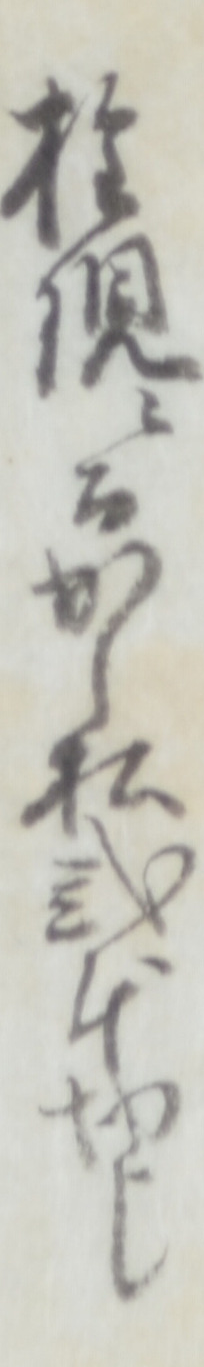権現ニ而から松弐本切申候
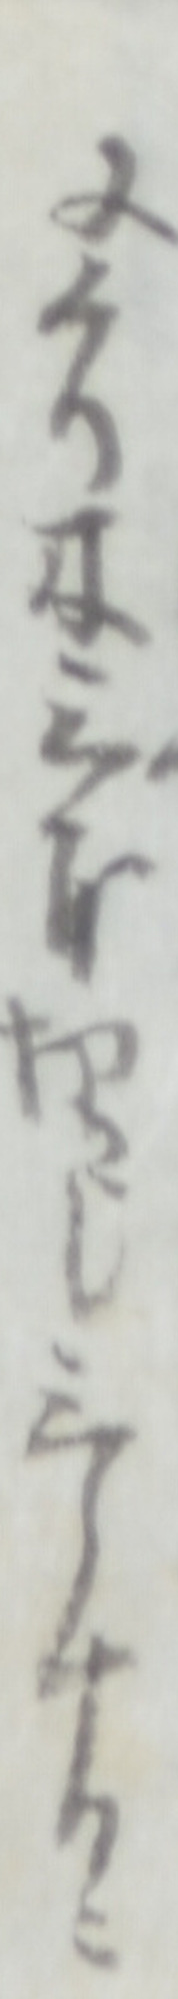又くり木三本切申候三月十日ニ
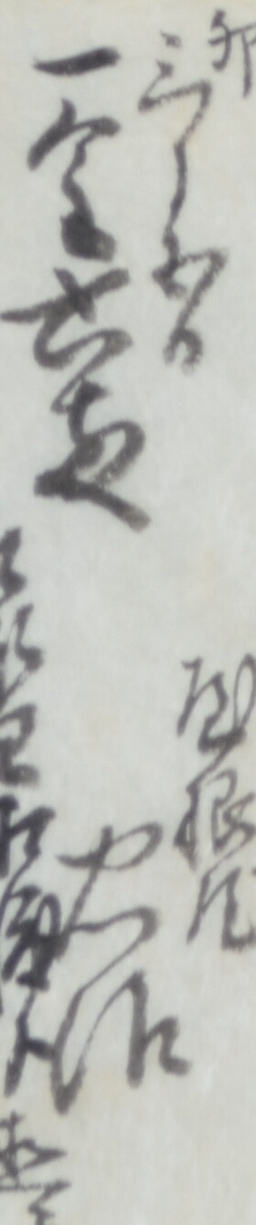一金六両忠治
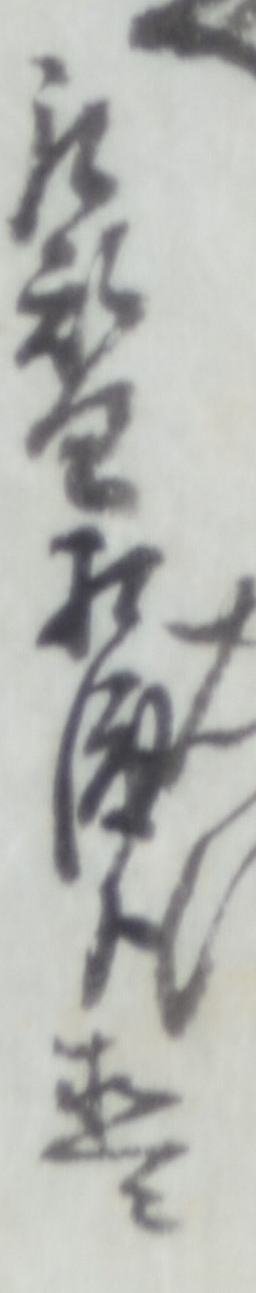江替相渡候直ニ

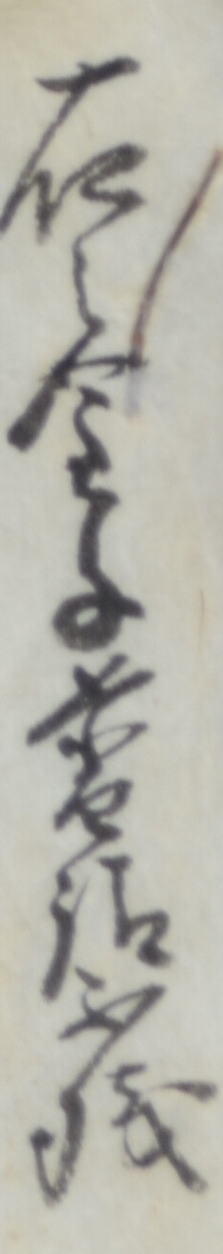右之金子普請不残
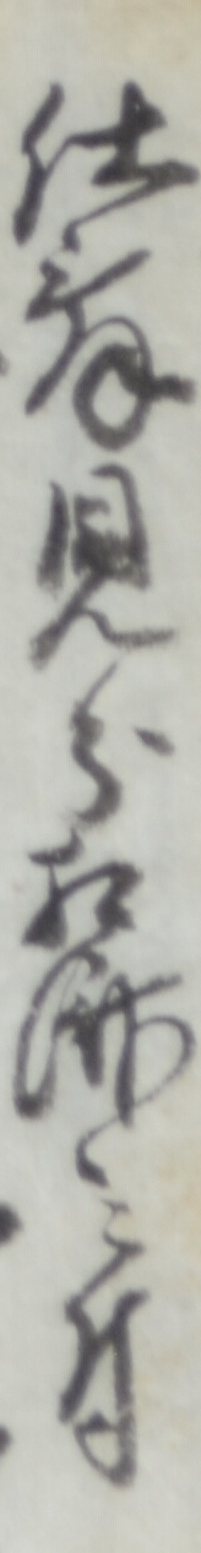仕舞見分相済候ニ付
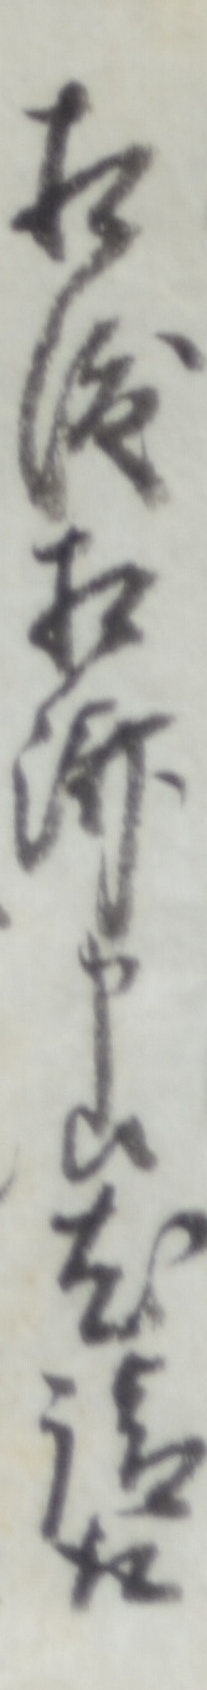相渡相済申候尤請取
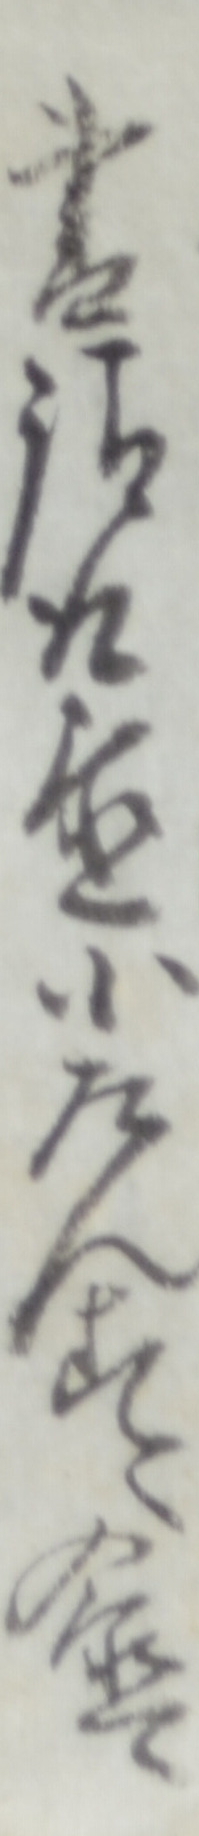書請取置小たんすへ入置候
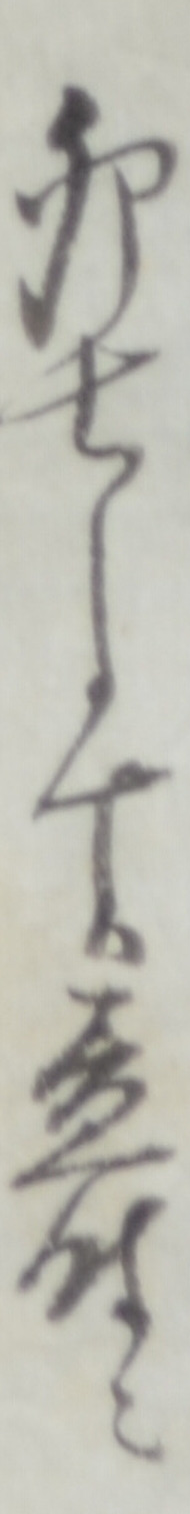卯七月十日昼時
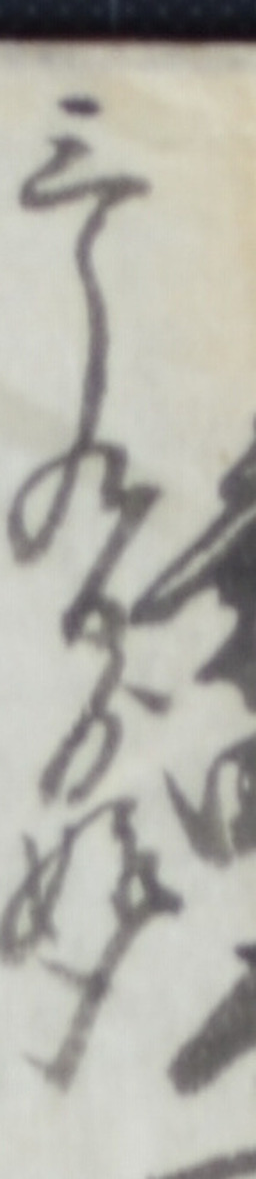三月九日ゟ始メ
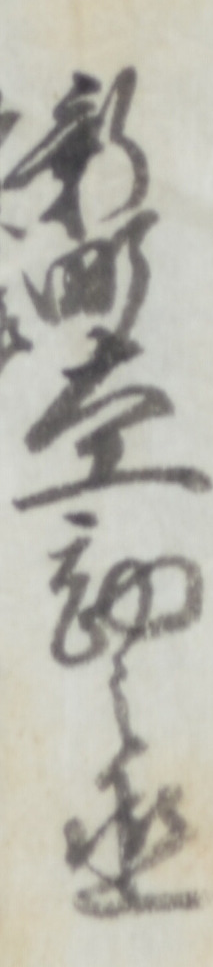新町大工勘之丞
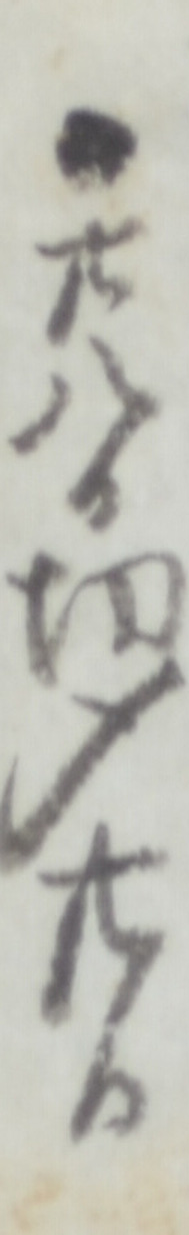●廿八日切〆廿日
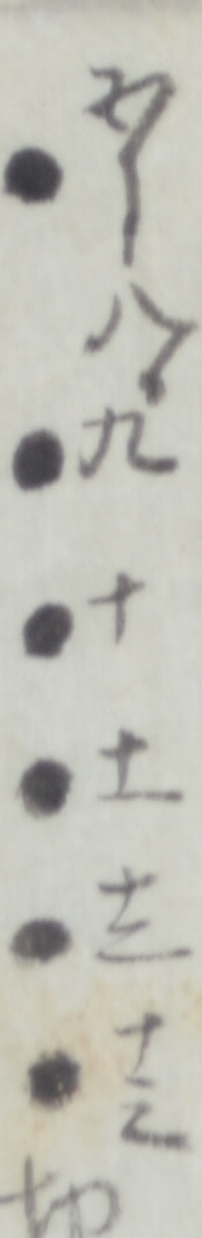五月八日九十十一十二十三
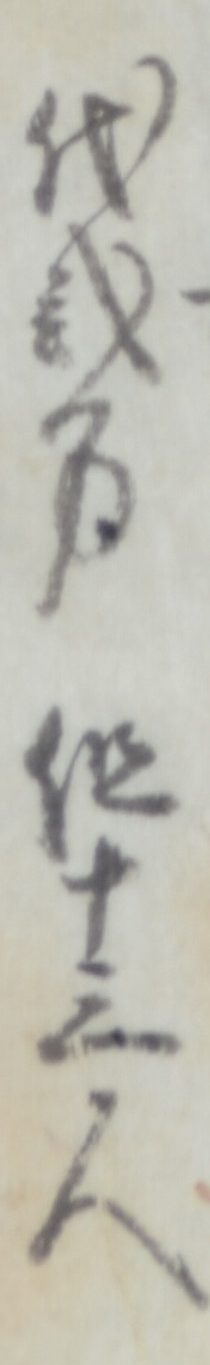代弐分但十三人
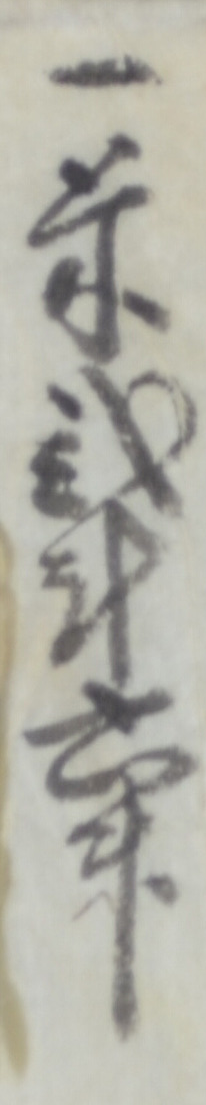一米弐斗六升
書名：権現末社寶蔵御門惣葺替覚帳
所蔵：伊那市立高遠町図書館・合同会社AMANE
